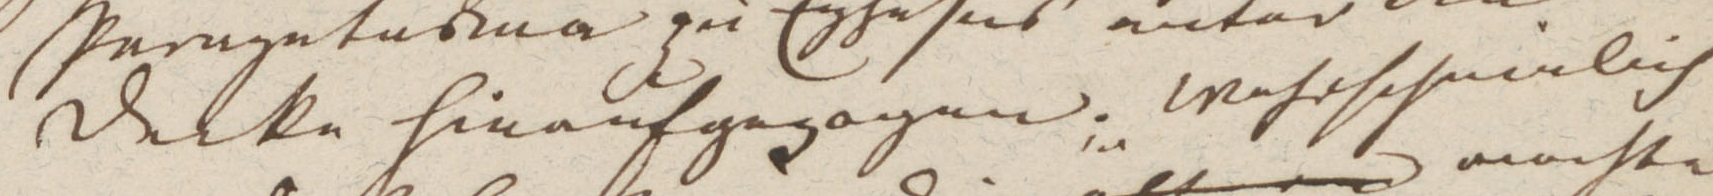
Decke hinaufgezogen; wahrscheinlich
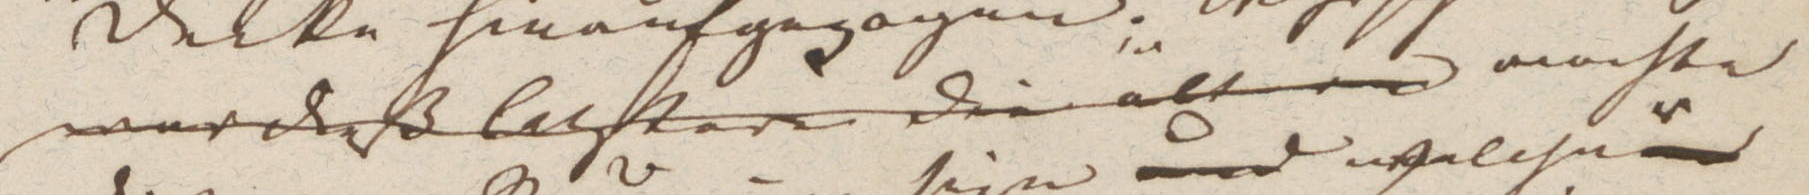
war diess letztere die ältere mochte
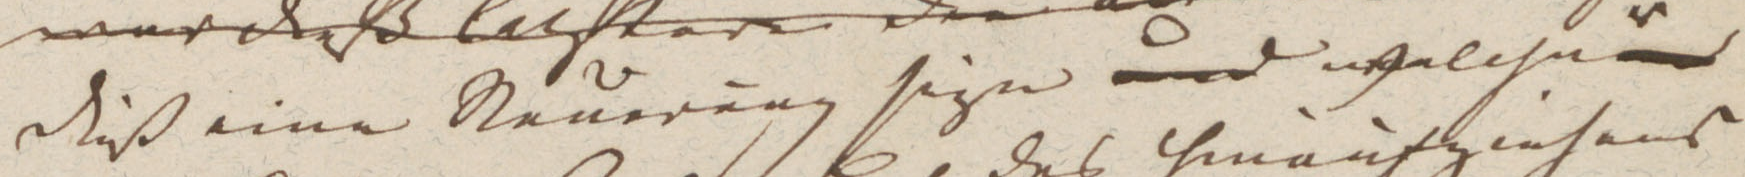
diess eine Neuerung seyn und welche r
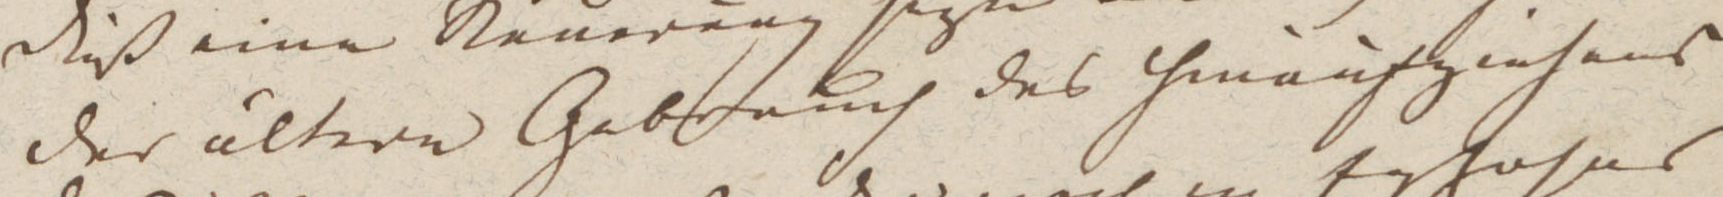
der ältere Gebrauch des Hinaufziehens
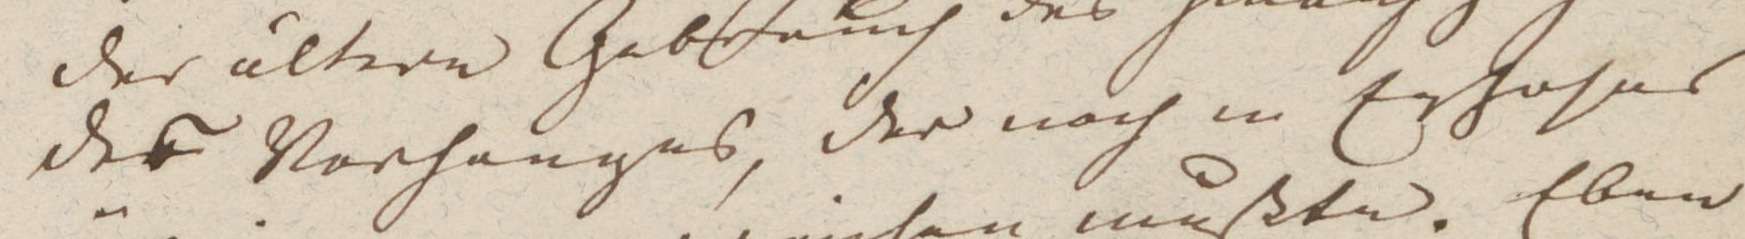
ders Vohanges, der noch in Ephesus
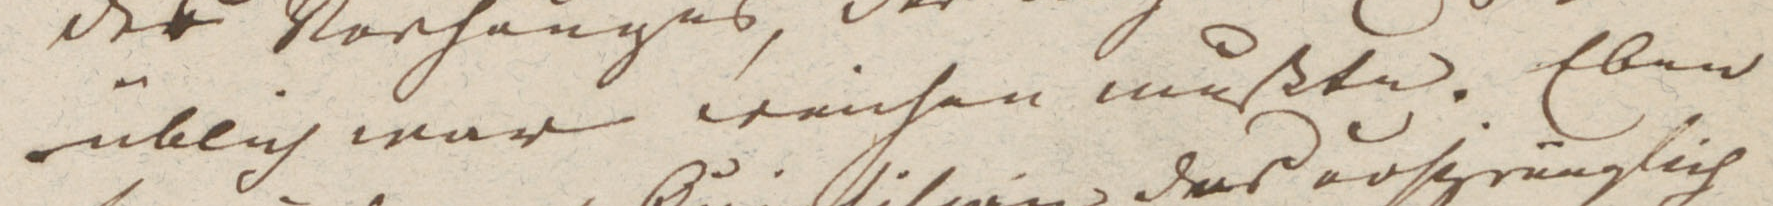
üblich war weichen musste. Eben
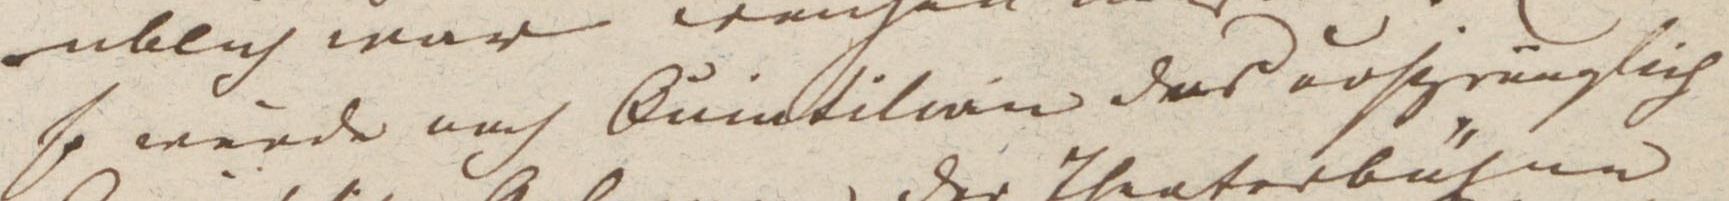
so wurde nach Quintilian das ursprünglich
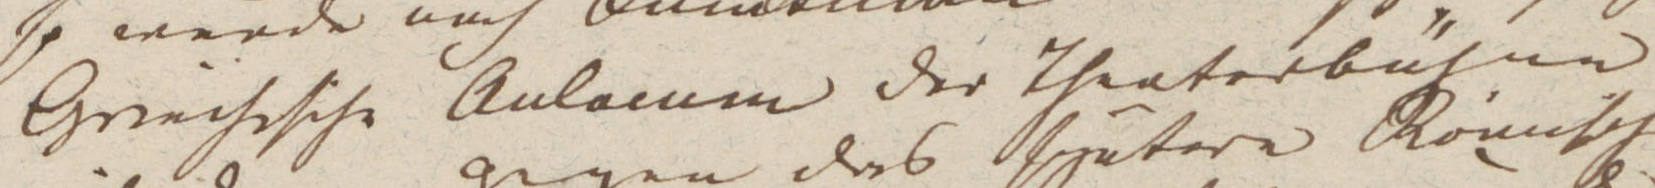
Griechische Aulaeum der Theaterbühne
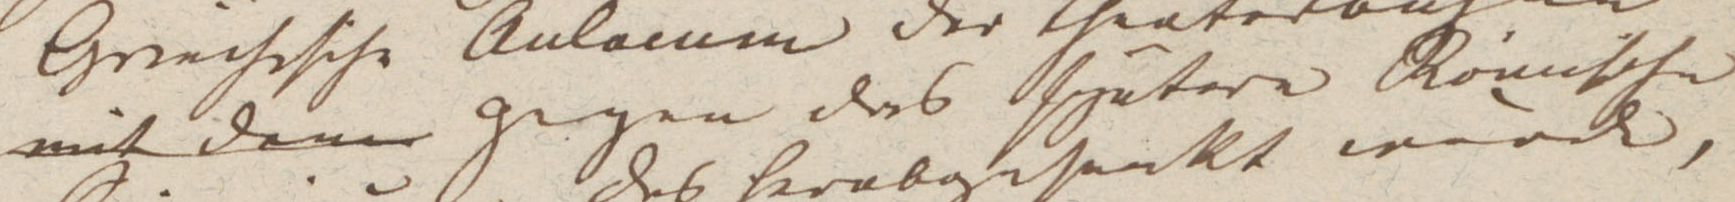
mit dem gegen das spätere Römische
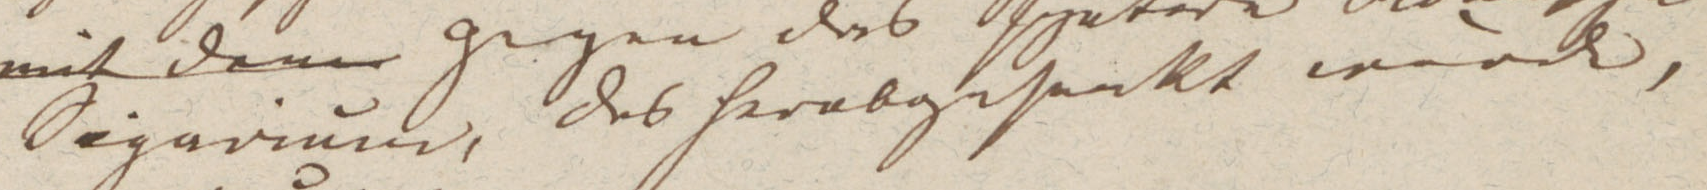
Siparium, das herabgesenkt wurde,
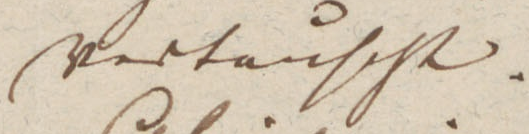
vertauscht.
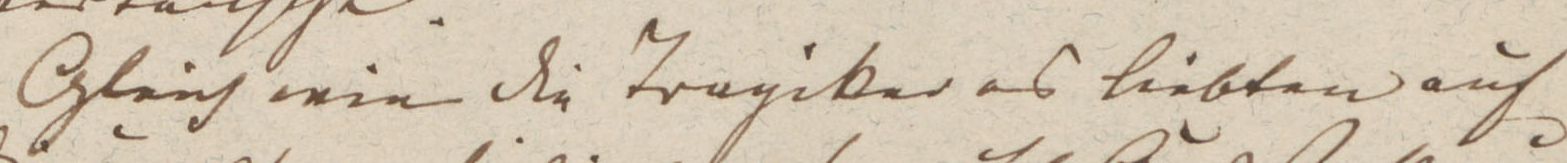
Gleich wie die Tragiker es liebten auf
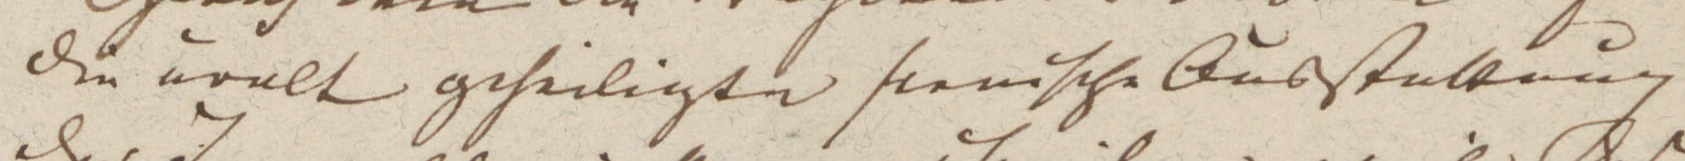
die uralt geheiligte scenische Ausstaltung
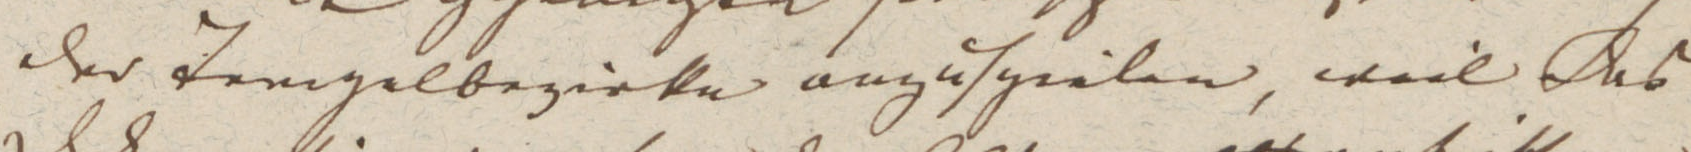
der Tempelbezirke anzuspielen, weil das
